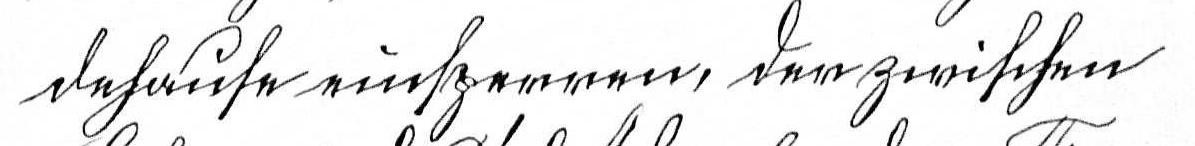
dehause einsperren, der zwischen
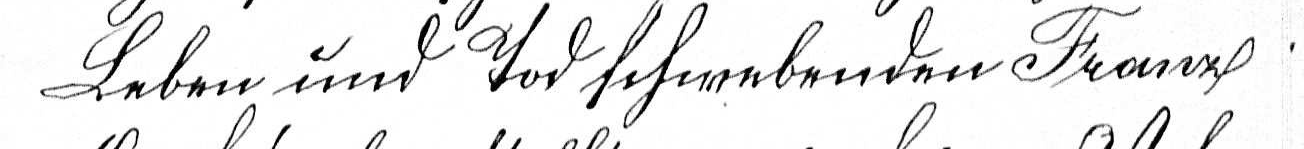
Leben und Tod schwebenden Franz
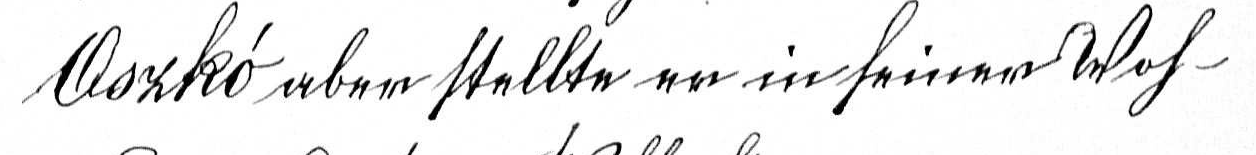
Oszkó aber stellte er in seiner Woh¬
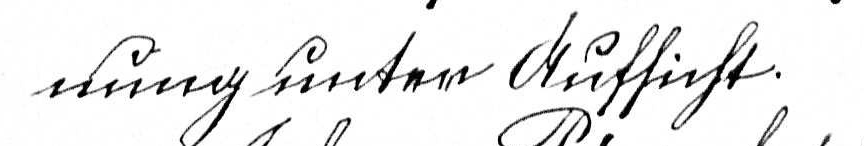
nung unter Aufsicht.
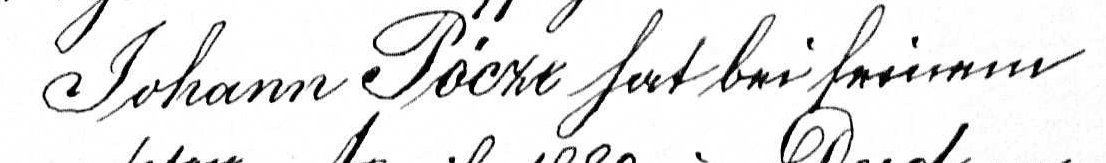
Johann Pöcze hat bei seinem
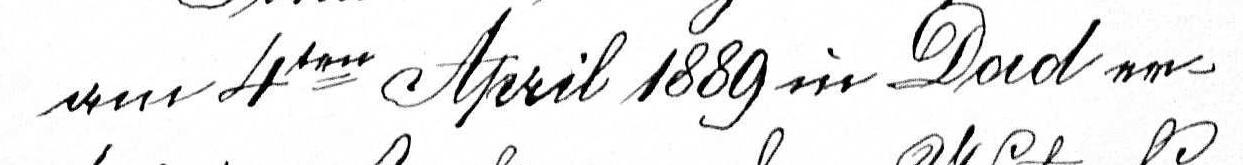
am 4ten April 1889 in Dad er¬
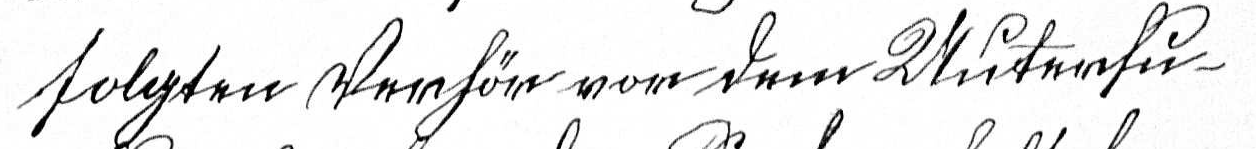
folgten Verhör vor dem Untersu¬
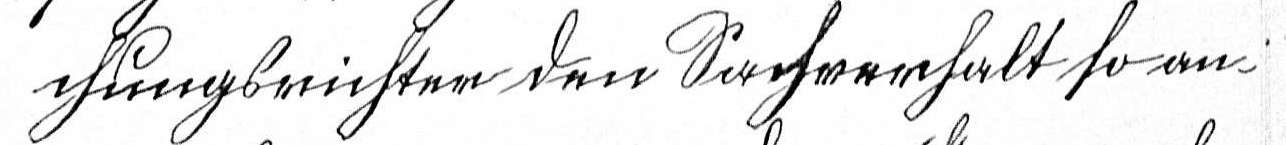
chungsrichter den Sachverhalt so an¬
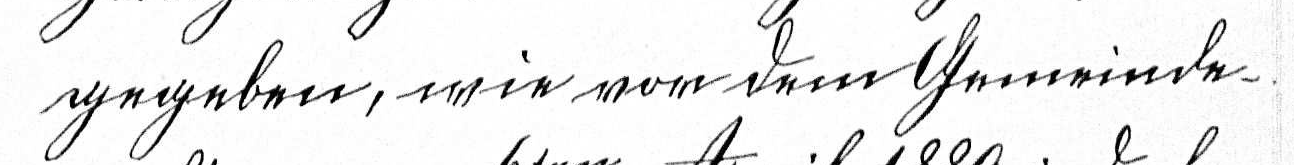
gegeben, wie vor dem Gemeinde¬
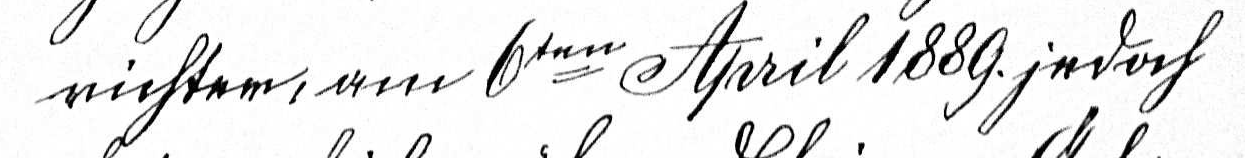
richter, am 6ten April 1889 jedoch
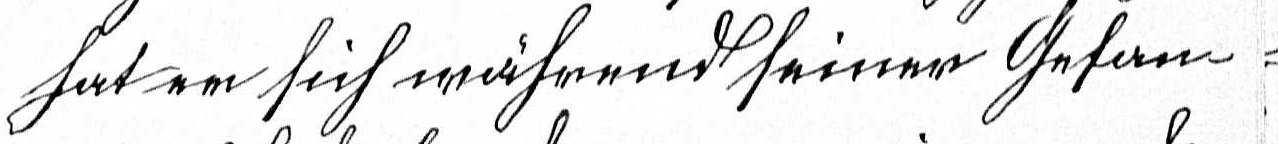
hat er sich während seiner Gefan¬
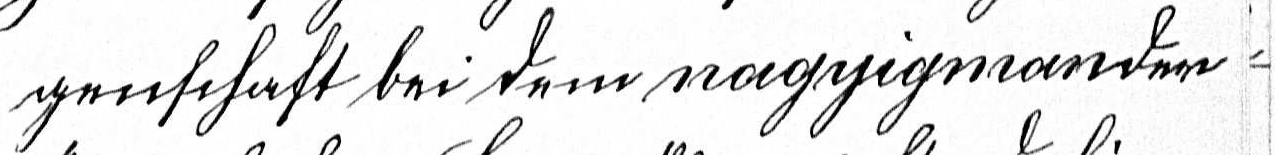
genschaft bei dem nagyigmander
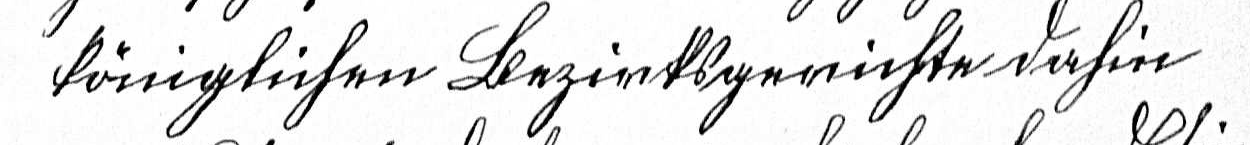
königlichen Bezirksgerichte dahin
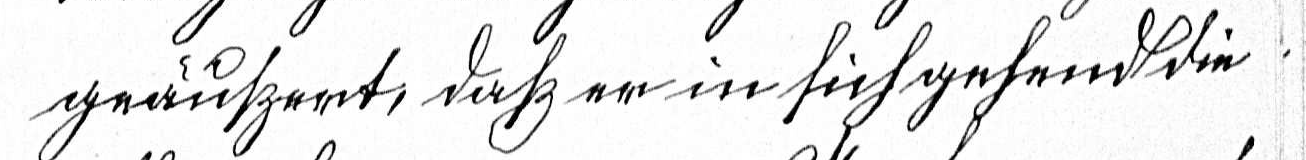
geäußert, daß er in sich gehend die
